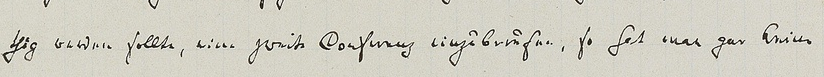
thig werden sollte, eine zweite Conferenz einzuberufen, so hat man gar keine
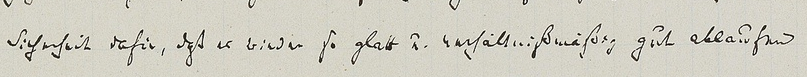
Sicherheit dafür, daß es wieder so glatt u. verhältnißmäßig gut ablaufen
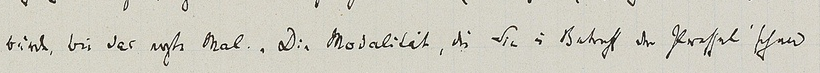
würde, wie das erste Mal. Die Modalität, die Sie in Betreff der Pressel'schen
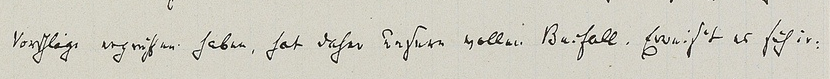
Vorschläge ergriffen haben, hat daher unsern vollen Beifall. Erweis't es sich ir-
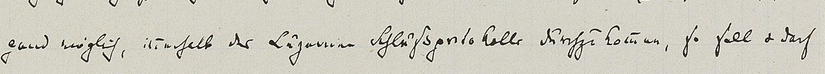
gend möglich, innerhalb des Luzerner Schlußprotokolles durchzukommen, so soll & darf
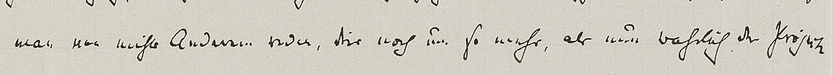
man von nichts Anderem reden, dies noch um so mehr, als nun wahrlich der Projecte
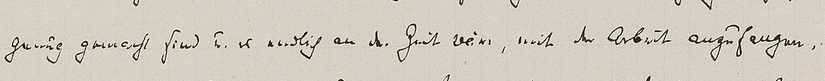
genug gemacht sind u. es endlich an der Zeit wäre, mit der Arbeit anzufangen.
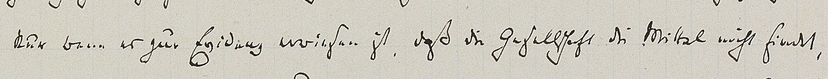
Nur wenn es zur Evidenz erwiesen ist, daß die Gesellschaft die Mittel nicht findet,
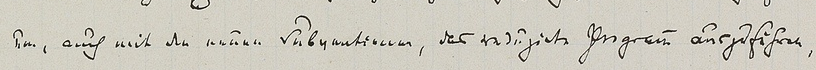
um, auch mit den neuen Subventionen, das reduzirte Programm auszuführen,
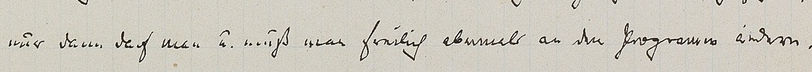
nur dann darf man u. muß man freilich abermals an dem Programme ändern.
